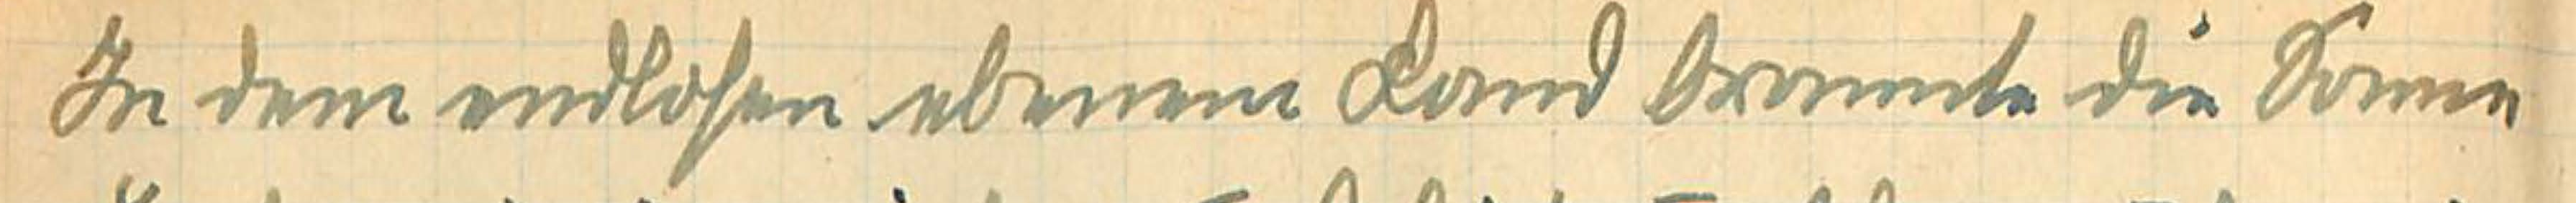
In dem endlosen ebenen Land brannte die Sonne
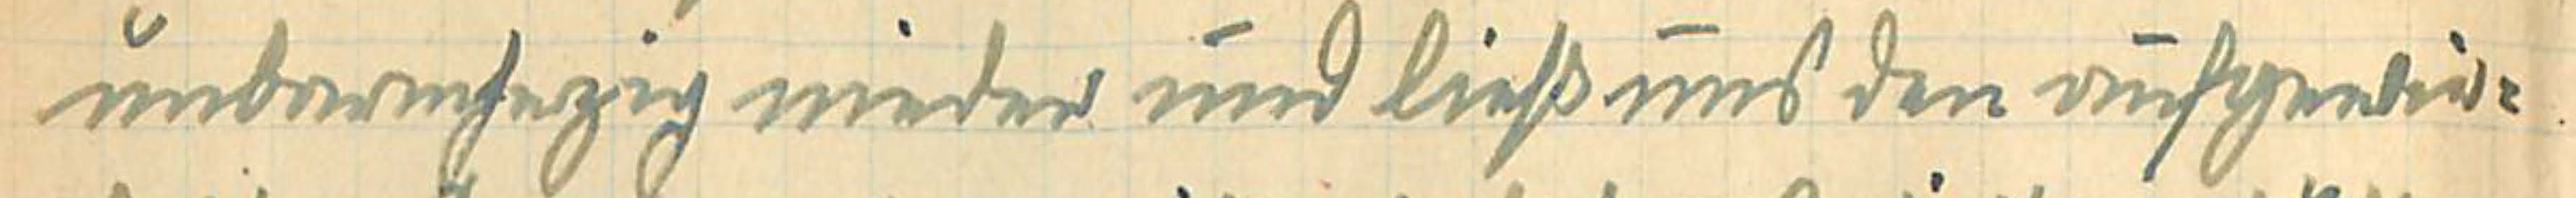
unbarmherzig nieder und ließ uns den aufgewir-
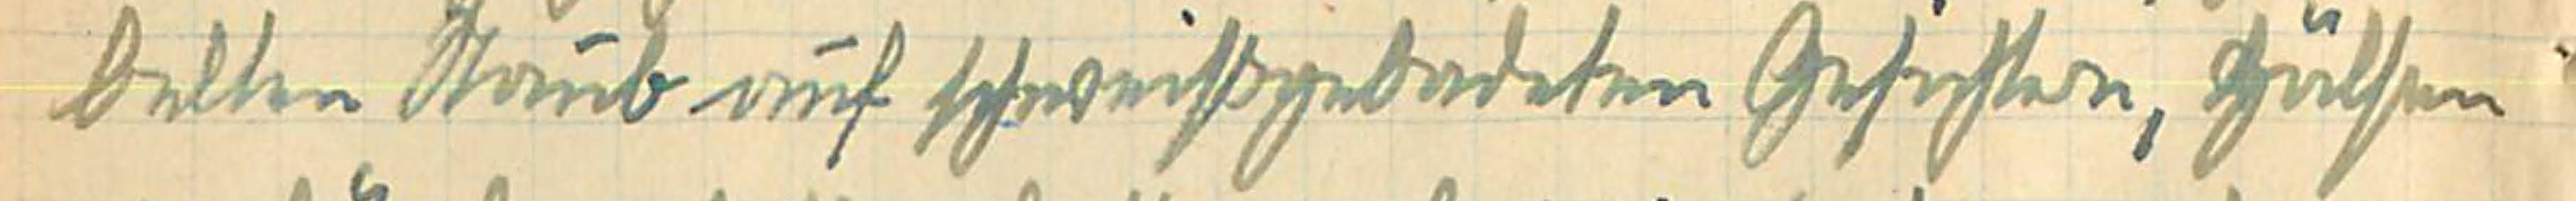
belten Staub auf schweißgebadeten Gesichtern, Hälsen
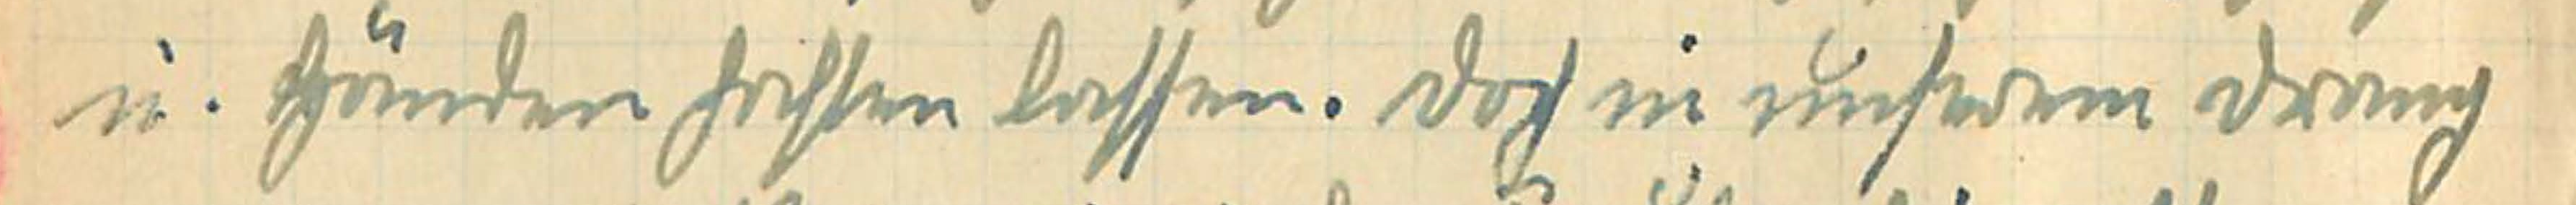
u. Händen haften lassen. Doch in unserem Drang
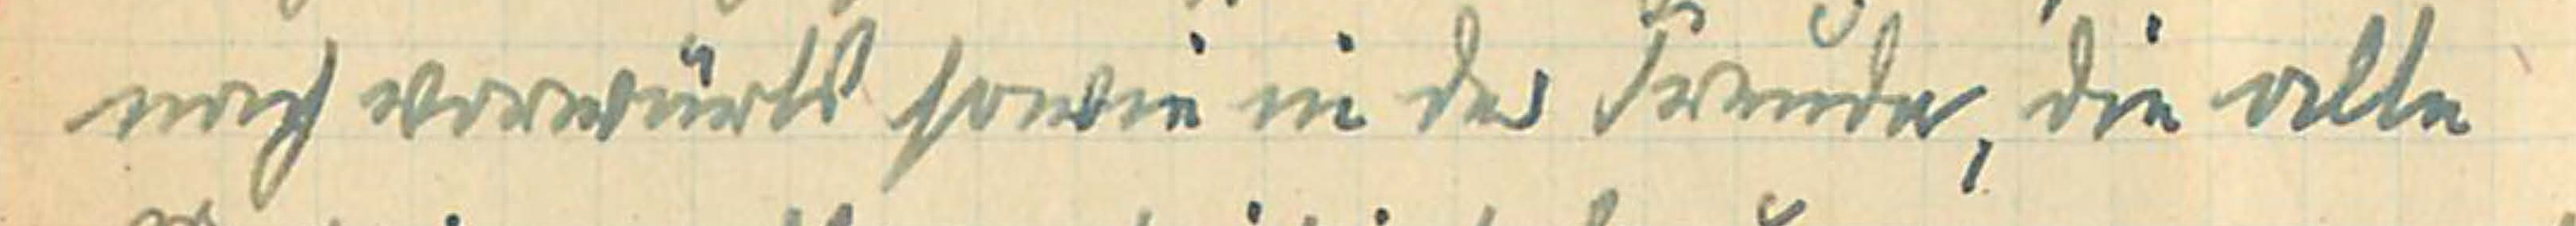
nach vorwärts sowie in der Freude, die alle
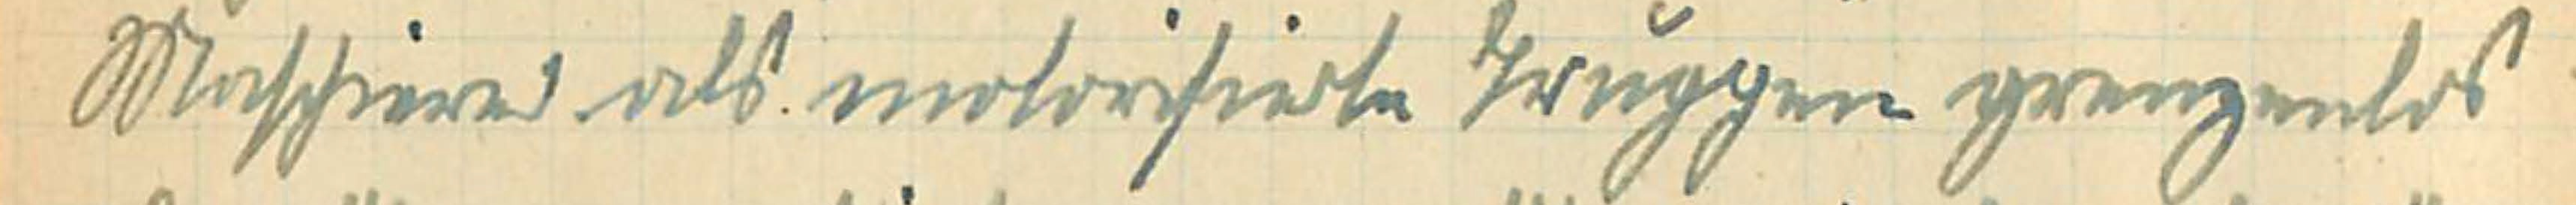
Maschierer als motorisierte Truppen grenzenlos
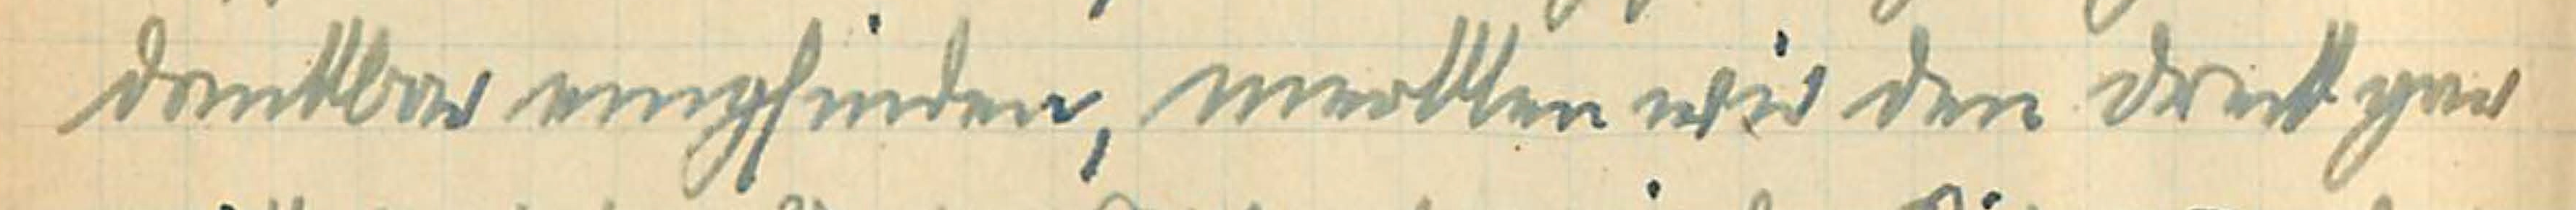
dankbar empfinden, merkten wir den Durst gar
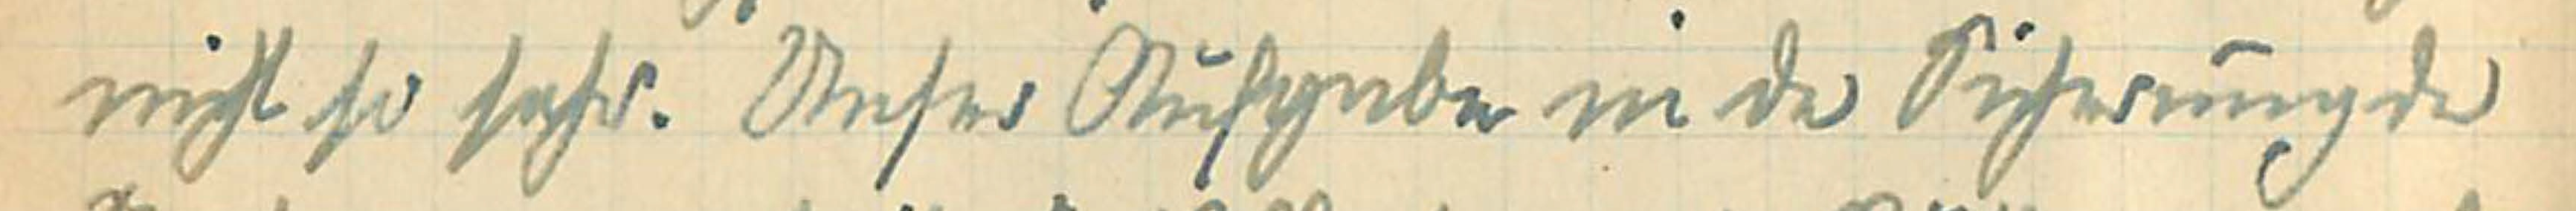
nicht so sehr. Unser Aufgabe in der Sicherung der
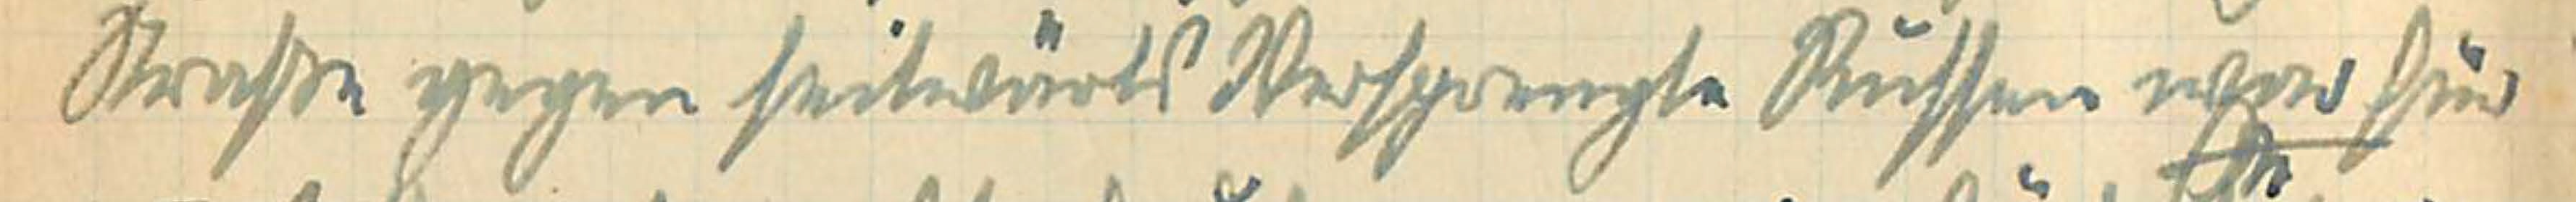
Straße gegen seitwärts Versprengte Russen war für
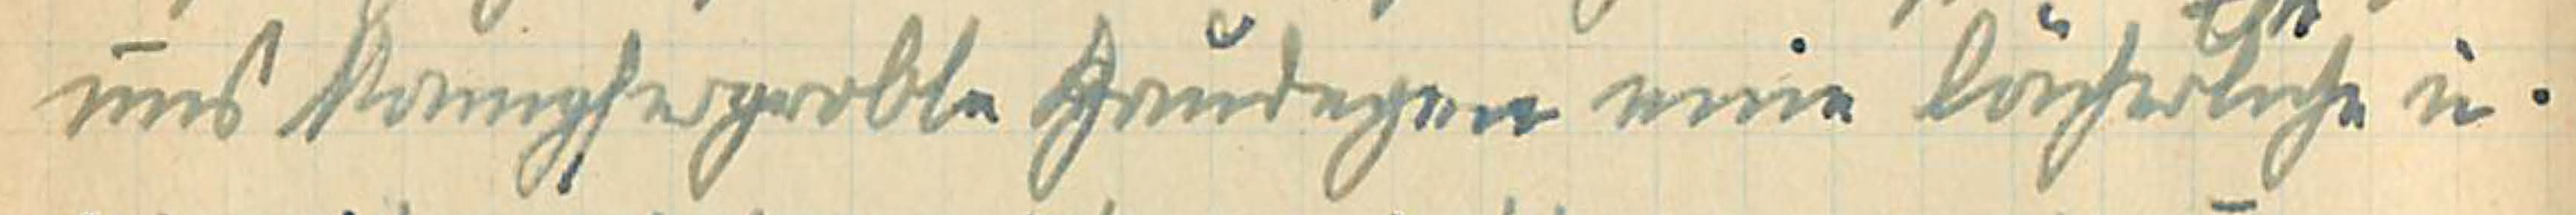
uns kampferprobten Haudegen eine lächerliche u.
